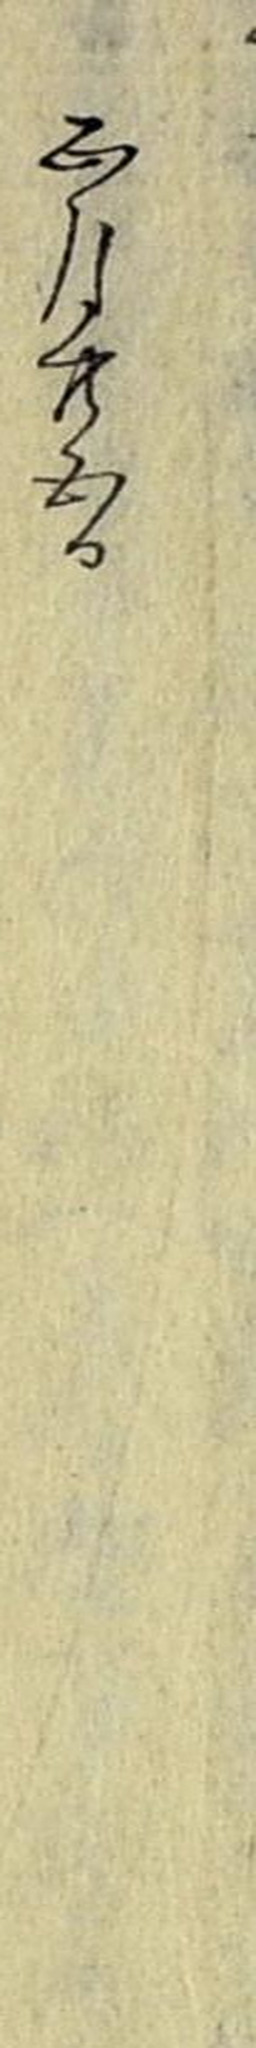正月廿五日
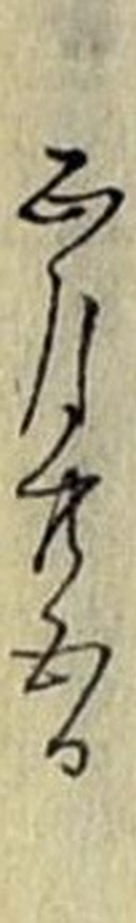正月廿五日
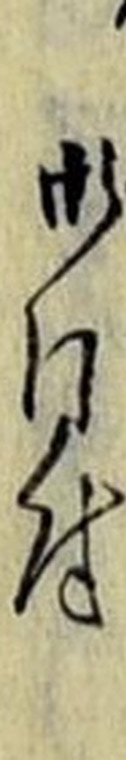御目付
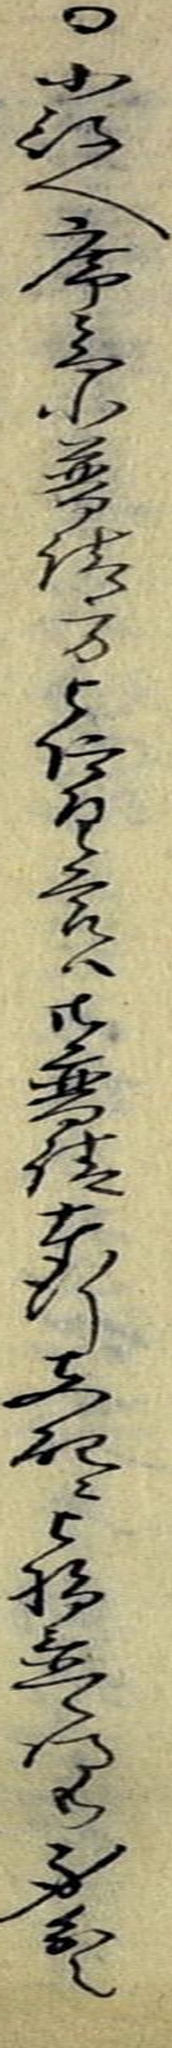○小役人席に而小普請方被仰付候節は御普請奉行支配に被指置候得共身分之
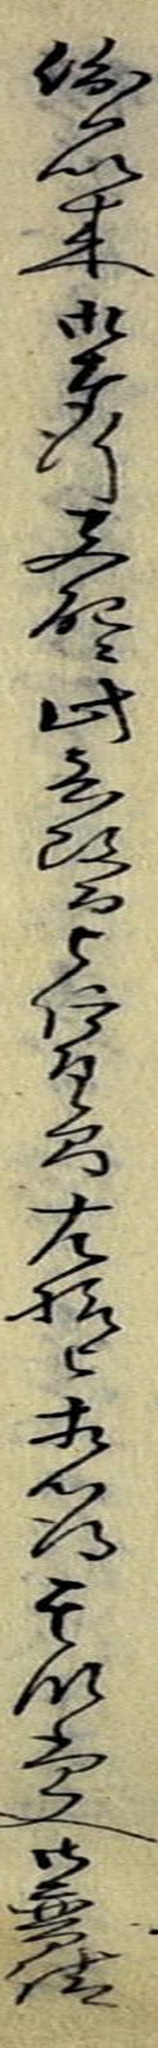儀は以來御奉行支配に此度改而被仰付候間左様被相心得其段尚又御普請
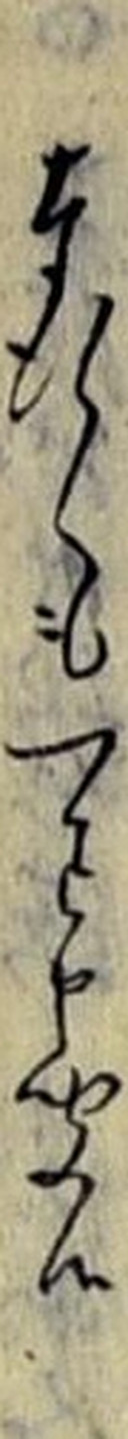奉行へも可被申聞候
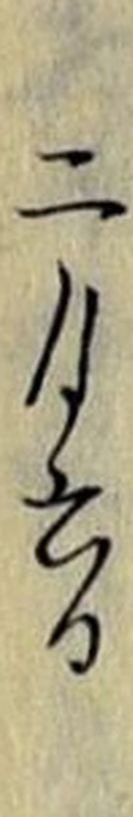二月六日
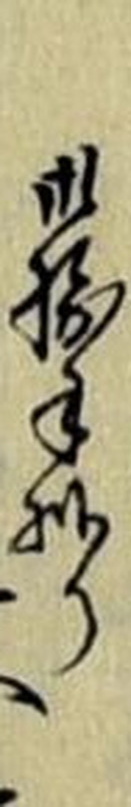御勝手掛り
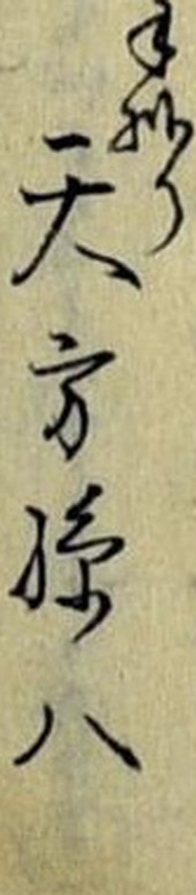天方孫八
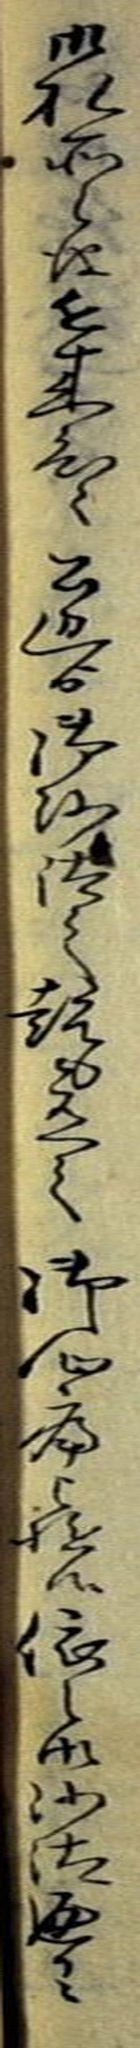○御札所之儀近来度々公辺ゟ御沙汰之趣も有之御心痛被遊候依之御沙汰通りに
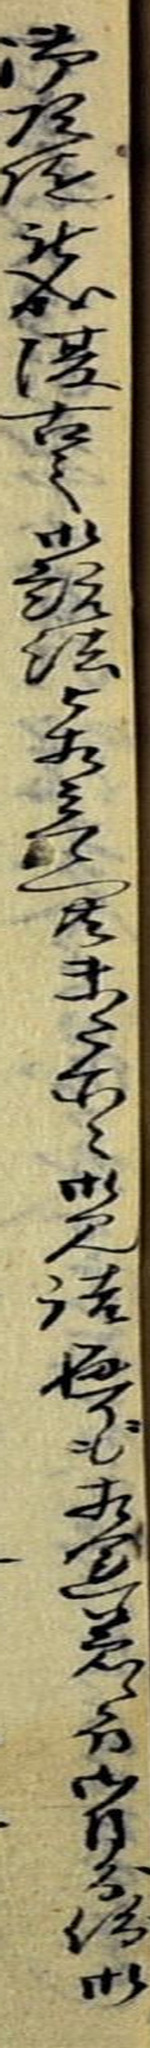御順随被成復古之御趣法被相立候へ共未た所々御見詰通りにも相運兼候に付御自分儀御
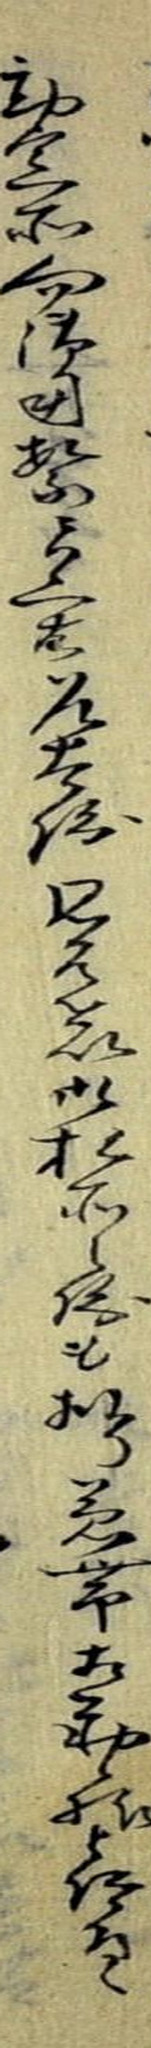勘定所向御用繋に候へ共乍太儀思召を以御札所之儀も掛り兼帯相勤候様被仰付候
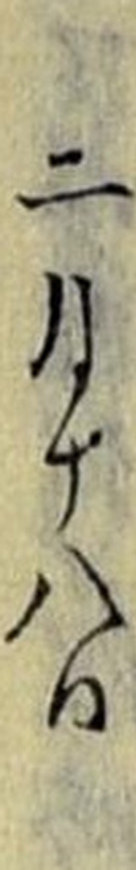二月十八日
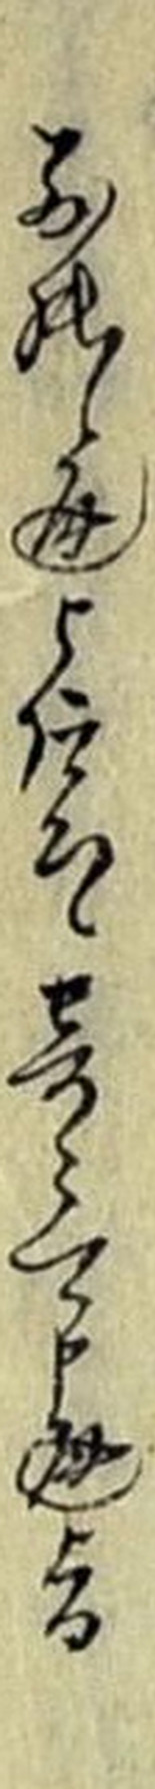別紙之通被仰出候寄々可申通旨
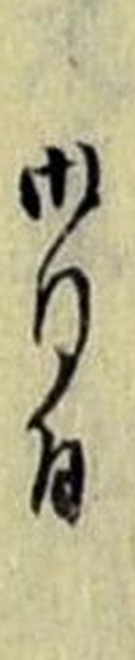御目付
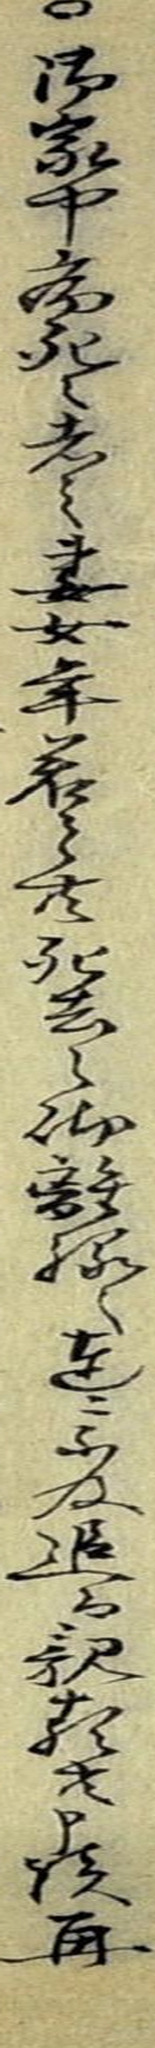○御家中病死之者之妻女年若に候共死去之砌り離縁之達に不及追而親類共申談再
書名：命令之部 六
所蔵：福井県文書館 Fukui Prefectural Archives
